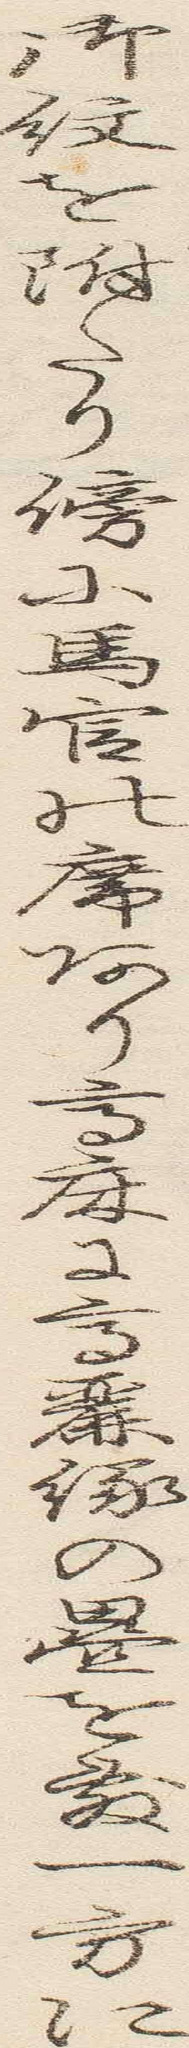御紋を附たり傍に馬官の席あり高床に高麗縁の疂を敷一方に
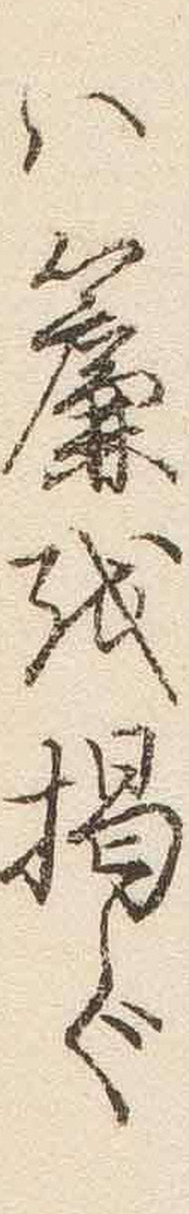は簾を掲ぐ
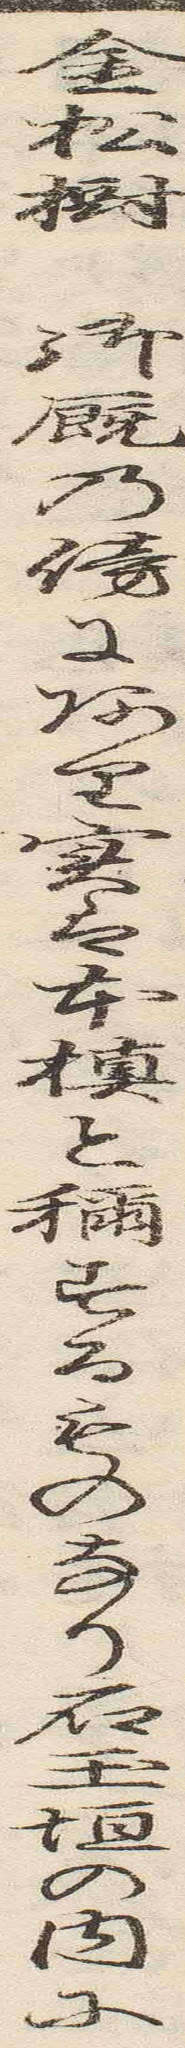金松𣗳御厩の傍にあり実は本槙と穪するものなり石玉垣の内に
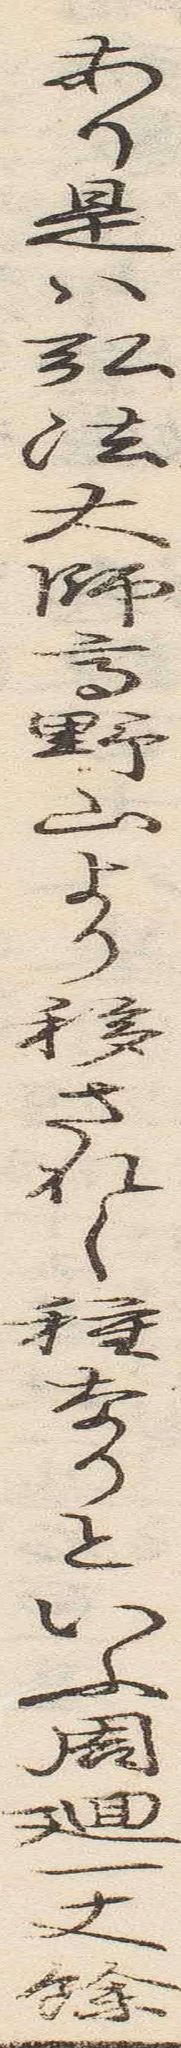あり是は弘法大師高野山より移されし種なりといふ周廽一丈餘
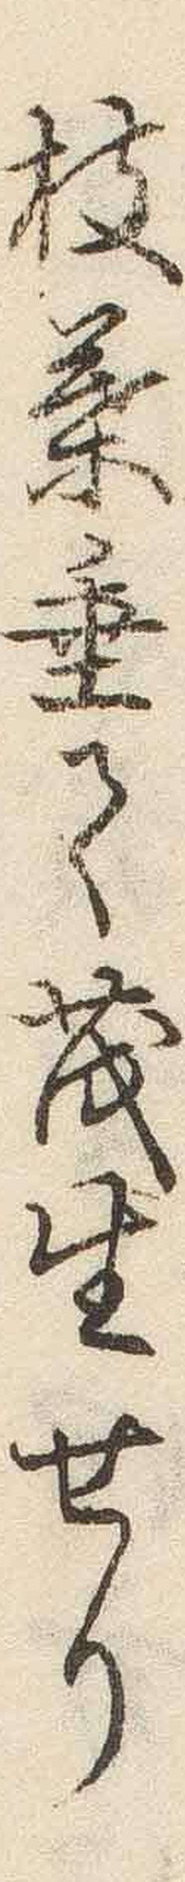枝葉垂て茂生せり
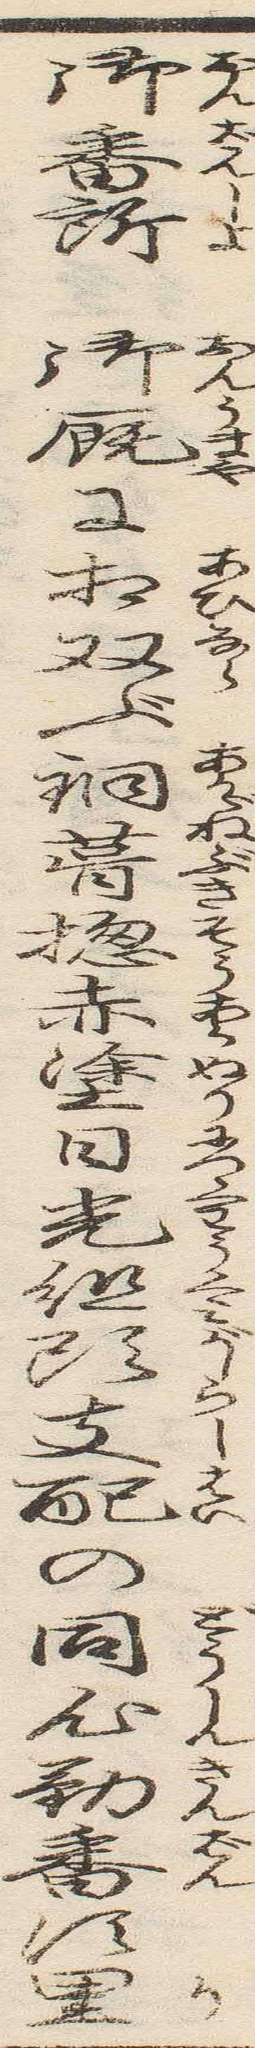御番所御厩に相双ぶ銅葺揔赤塗日光組頭支配の同心勤番す里
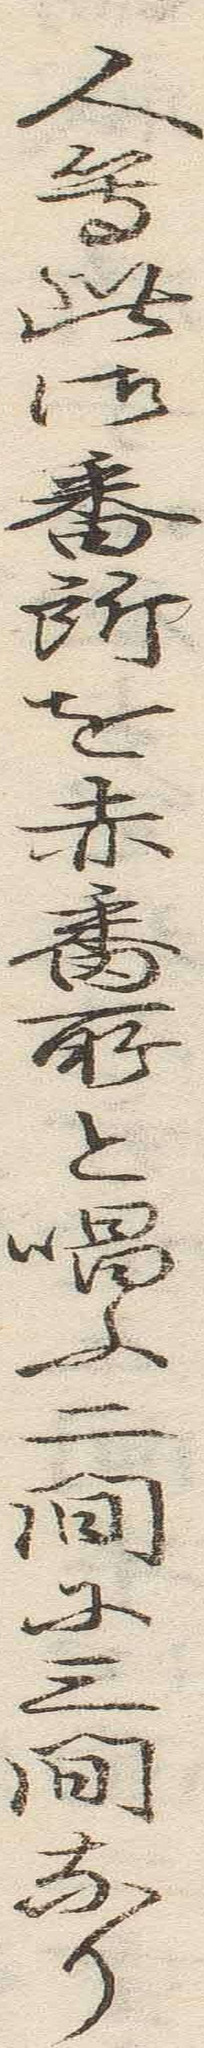人等此御番所を赤番所と唱ふ二間に三間なり
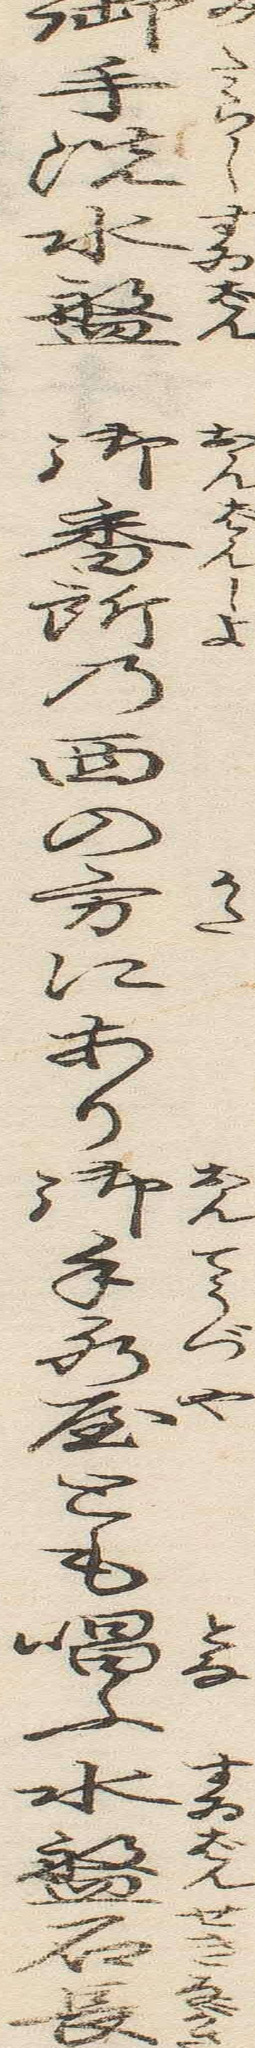御手洗水盤御番所の西の方にあり御手水屋とも唱ふ水盤石長
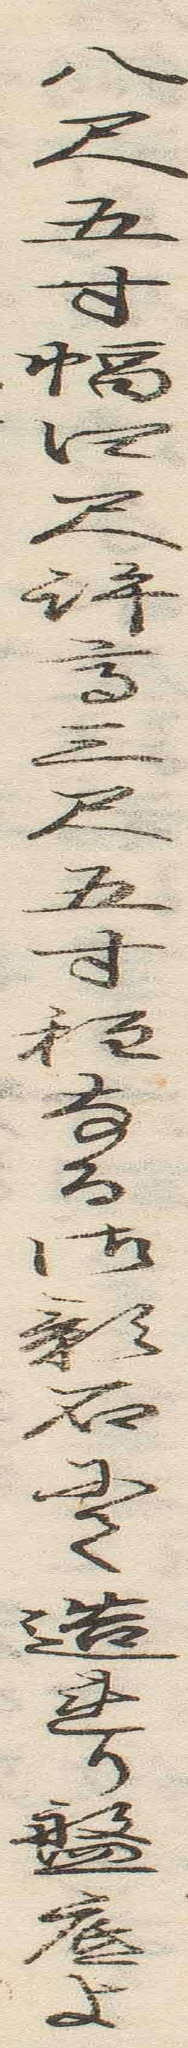八尺五寸幅四尺許高三尺五寸程なる御影石にて造れり盤底よ
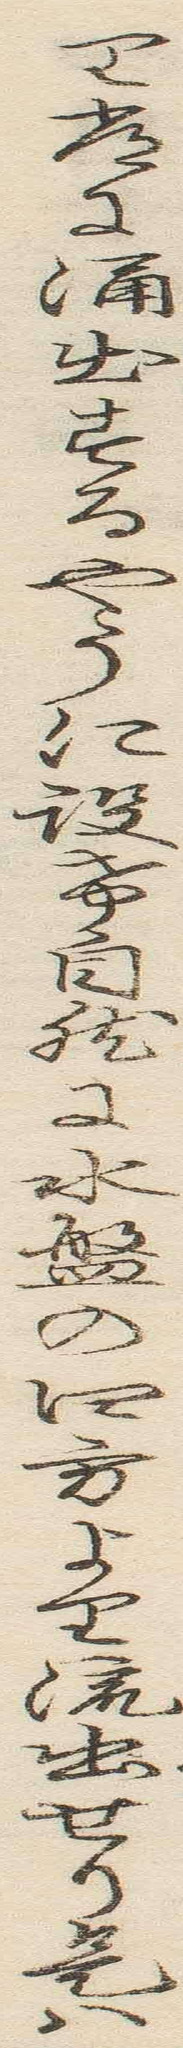り常に涌出するやうに設け自然に水盤の四方より流出せり是は
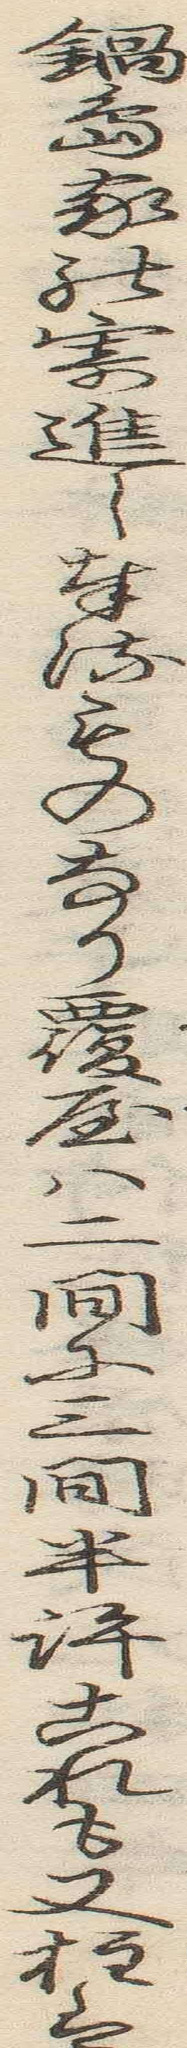鍋島家の寄進し奉るものなり覆屋は二間に三間半許これも又柱は
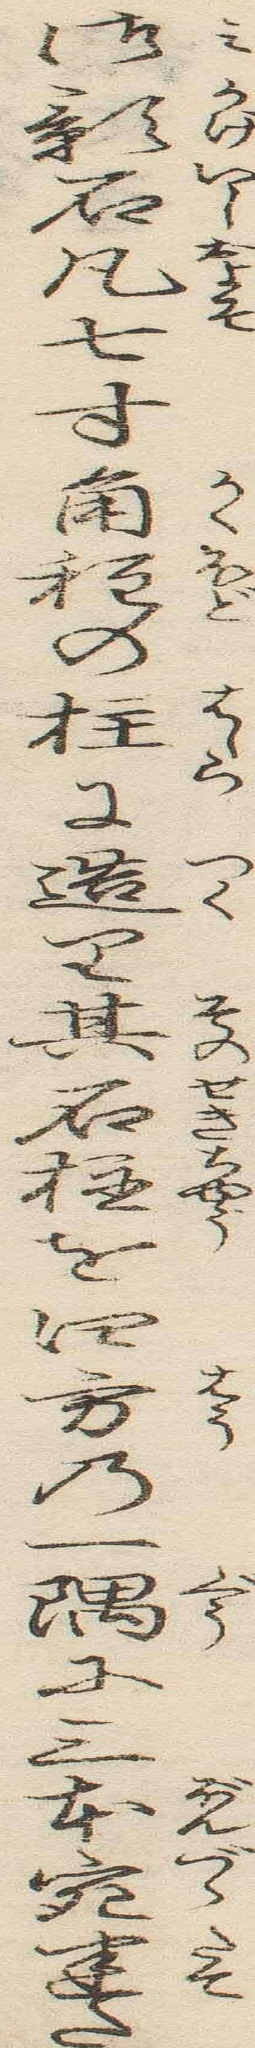御影石凡七寸角程の柱に造り其石柱を四方の一隅に三本宛建た
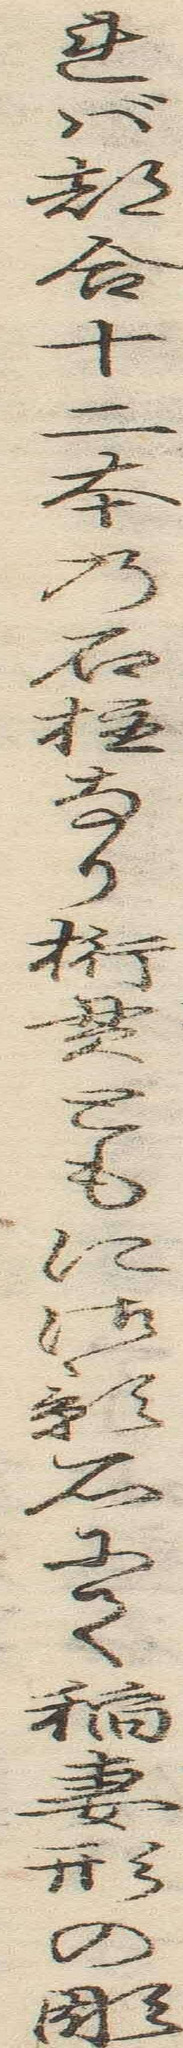れば都合十二本の石柱なり桁貫ともに御影石にて稲妻形の彫
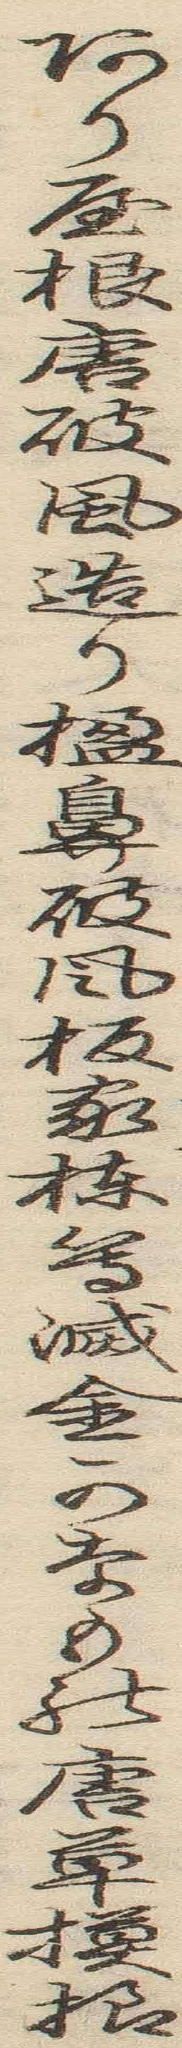あり屋根唐破風造り楹鼻破風板屋棟等滅金かなもの唐草摸様

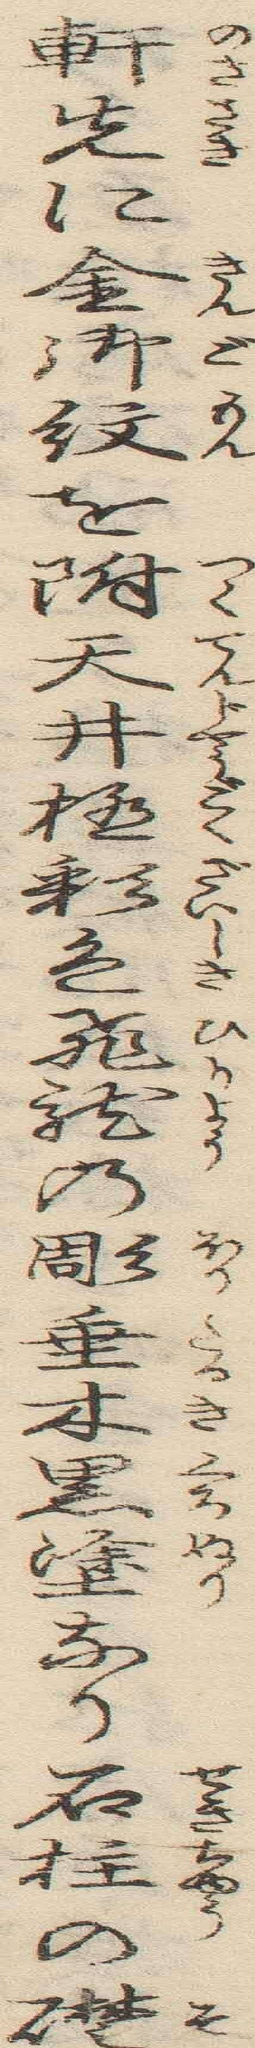軒先に金御紋を附天井極彩色飛龍の彫垂木黒塗なり石柱の礎
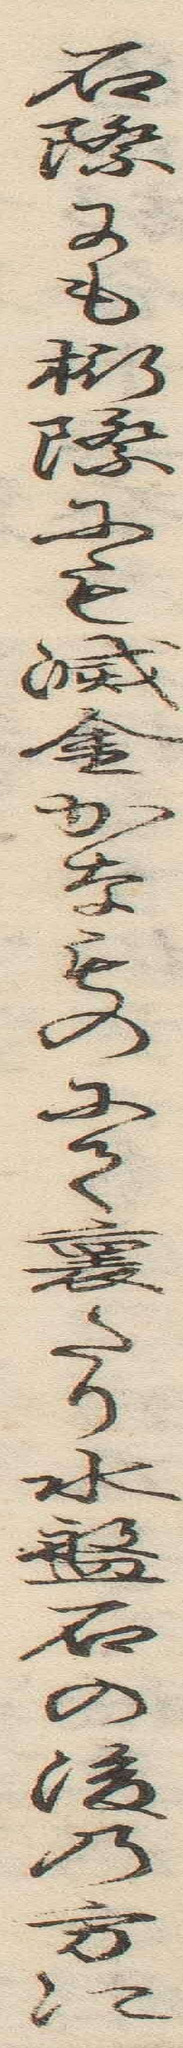石際にも桁際にも滅金かなものにて褱たり水盤石の後の方に
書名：日光山志
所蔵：東京学芸大学附属図書館 国文学研究資料館
